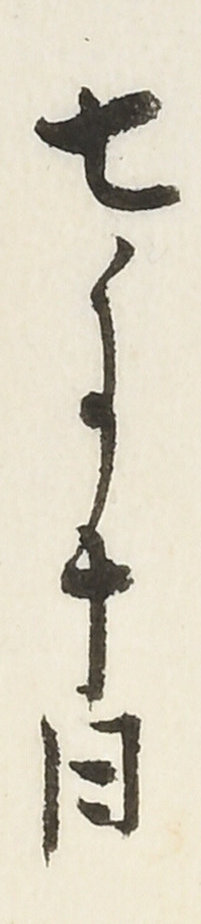七月十日
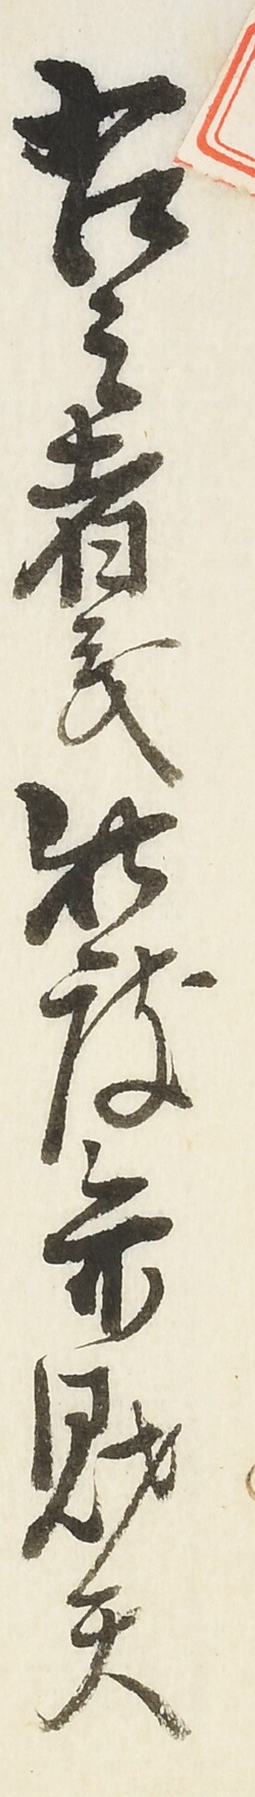右之者義此度弁財天
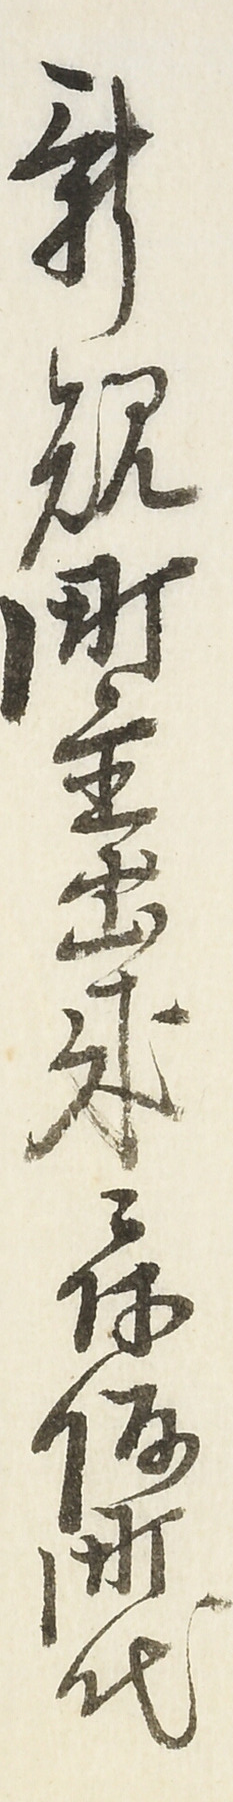新規町並出来ニ付仮町代
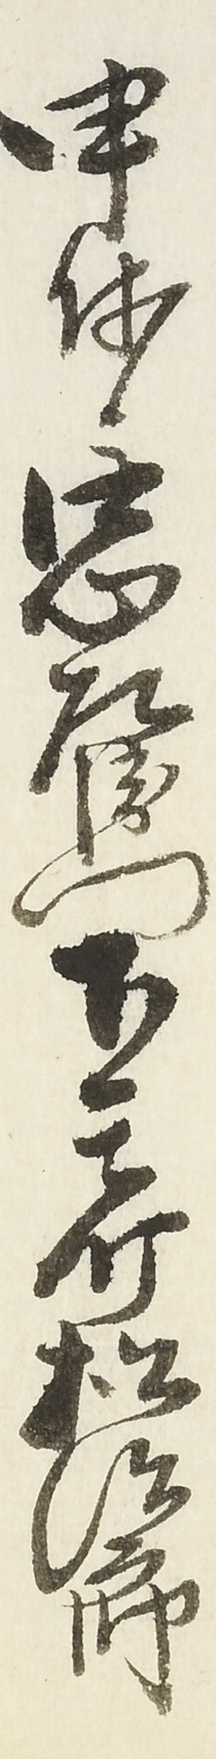申付候忠左衛門下モ町松治郎
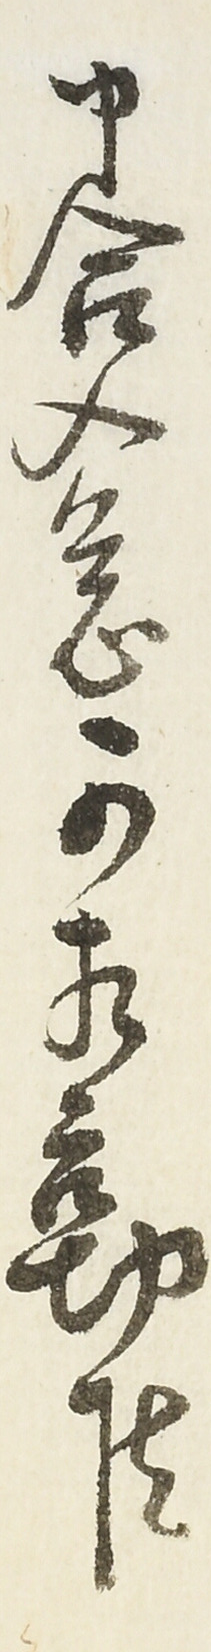申合入念可相勤候
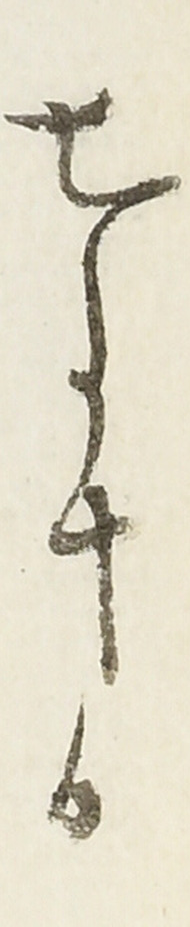七月十日
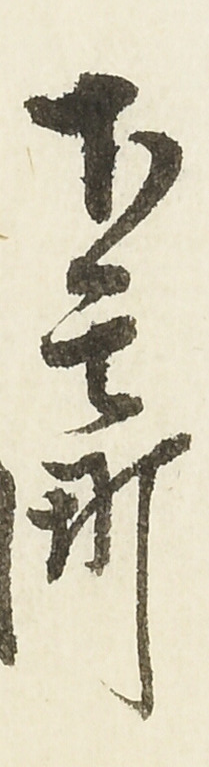下モ町
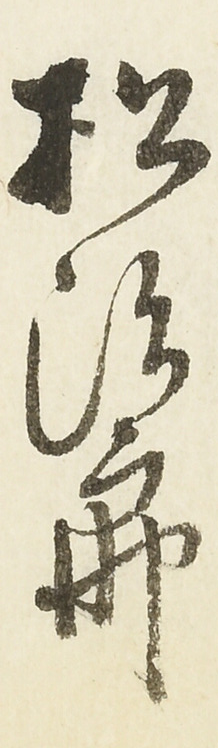松治郎
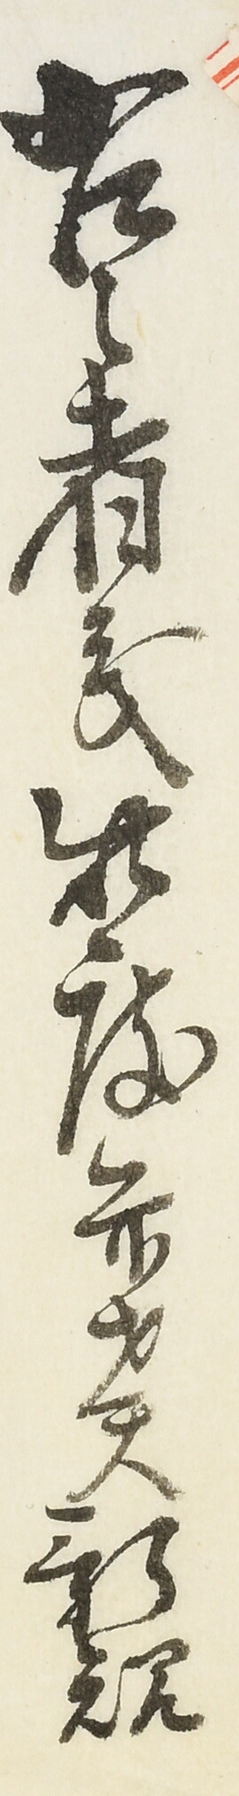右之者義此度弁才天新規
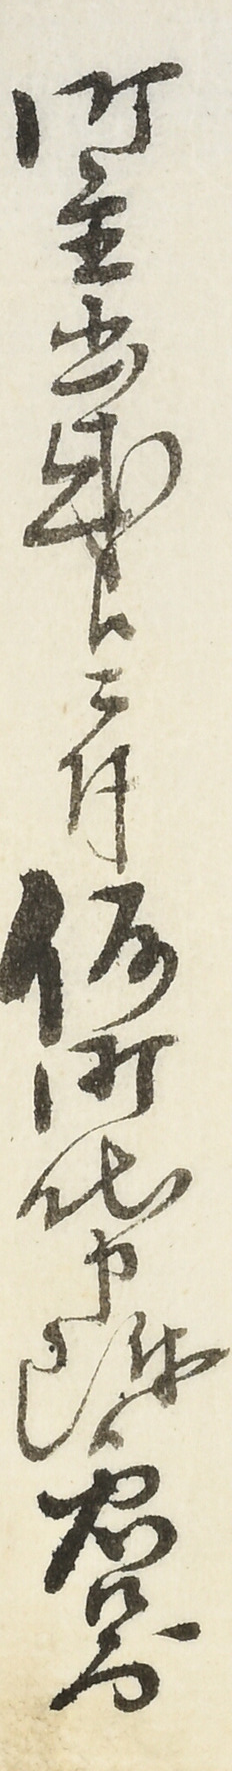町並出来ニ付仮町代申付候忠左衛門

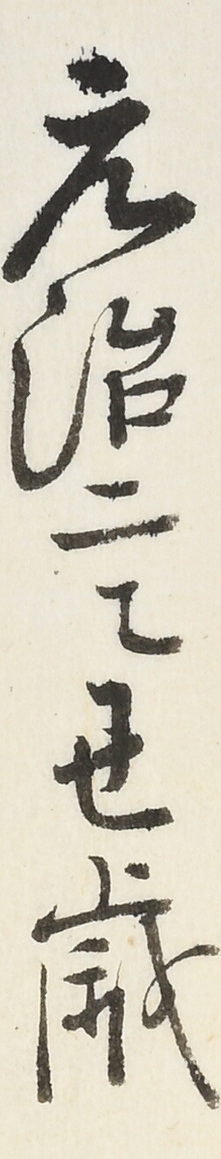元治二乙丑歳
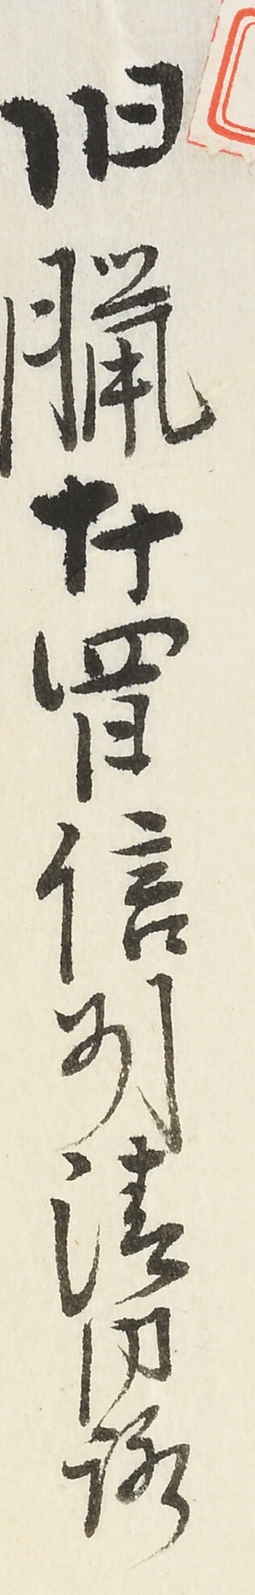旧臘廿四日信州清内路
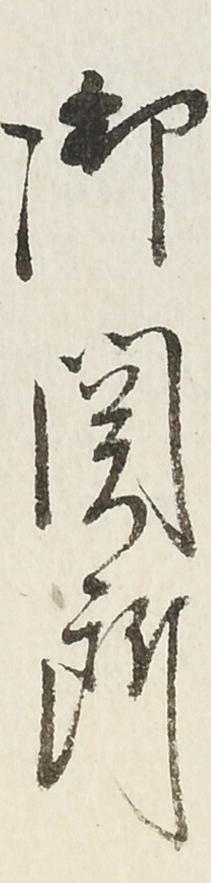御関所
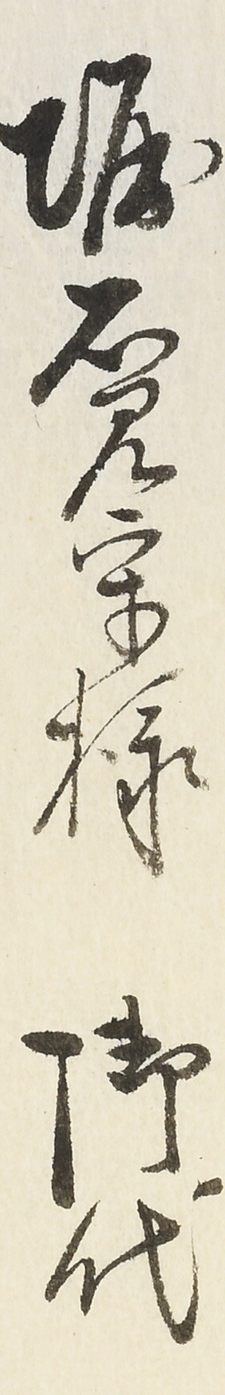堀石見守様御代
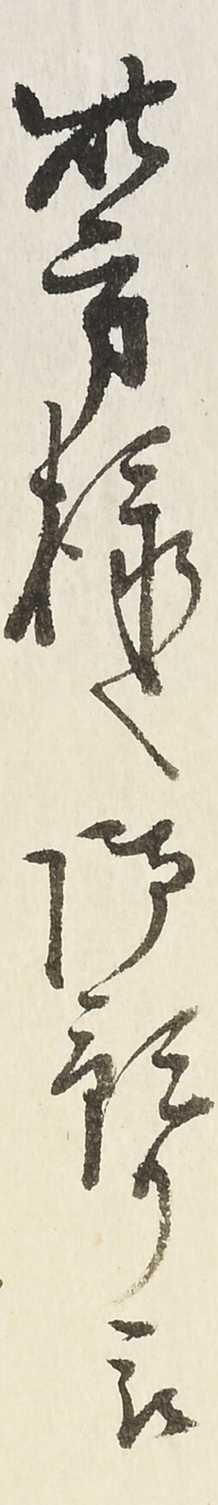此方様へ御預り被
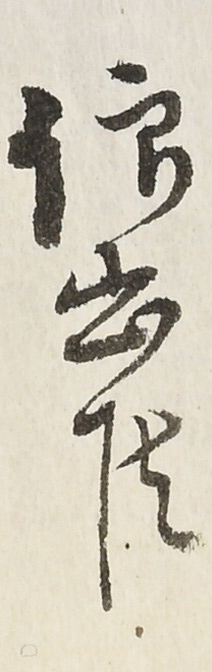仰出候
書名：御触書留
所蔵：伊那市立高遠町図書館・合同会社AMANE
